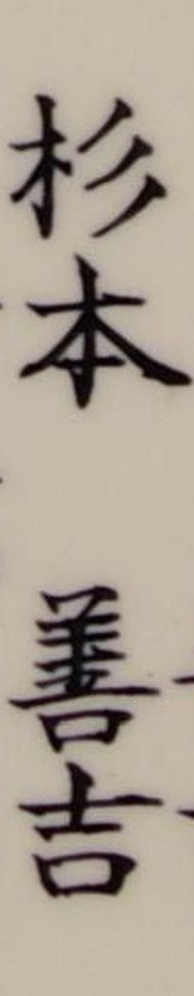杉本善吉
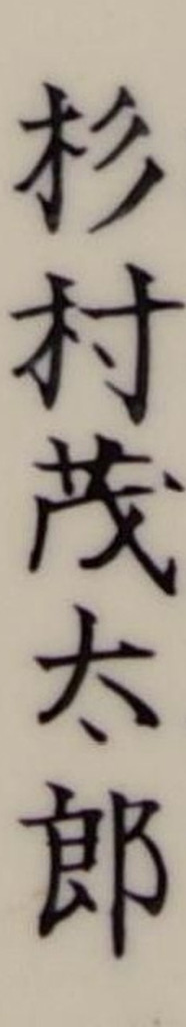杉村茂太郎

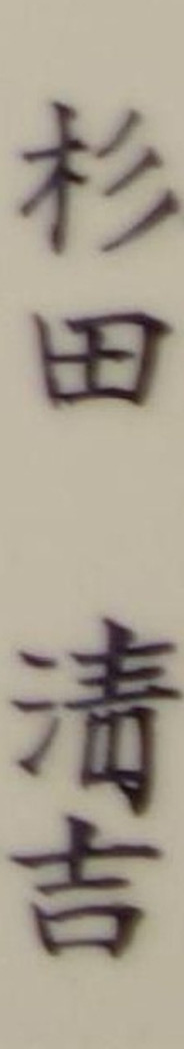杉田清吉
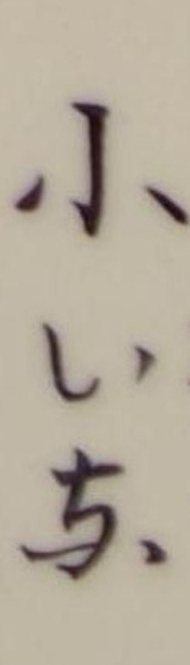小いな

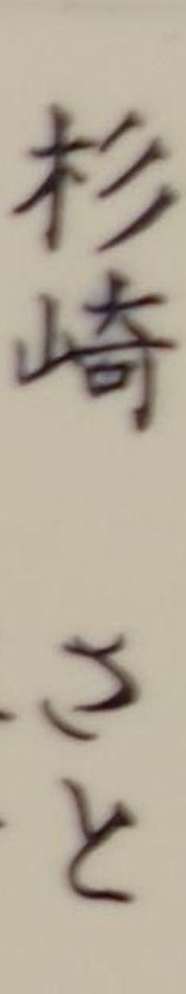杉崎さと
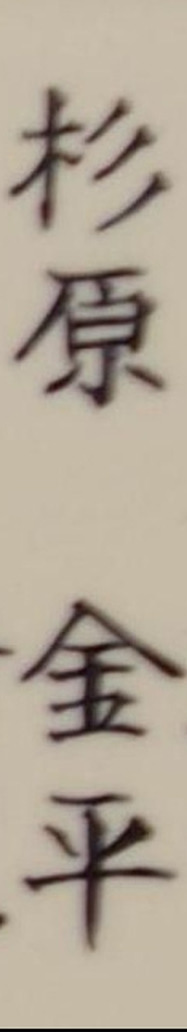杉原金平
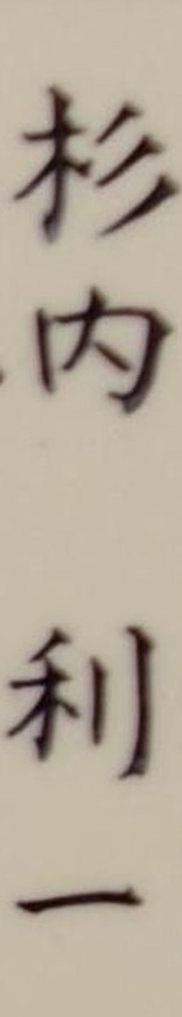杉内利一
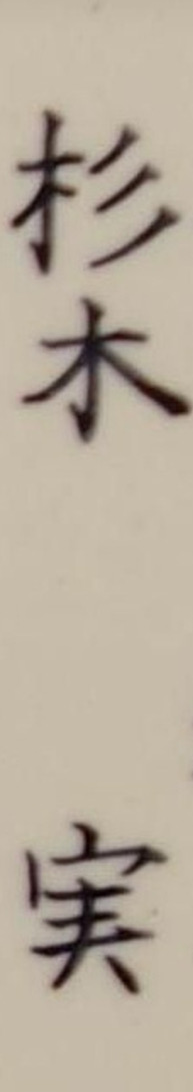杉木実
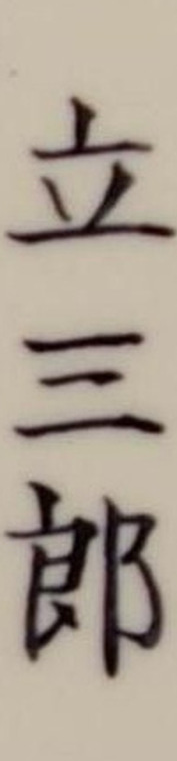立三郎
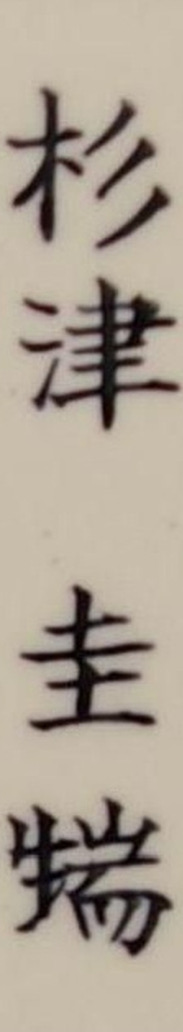杉津圭端
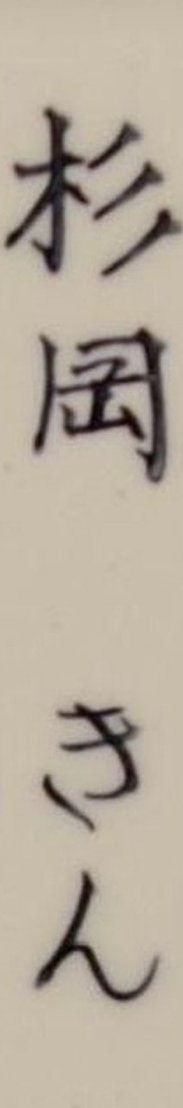杉岡きん
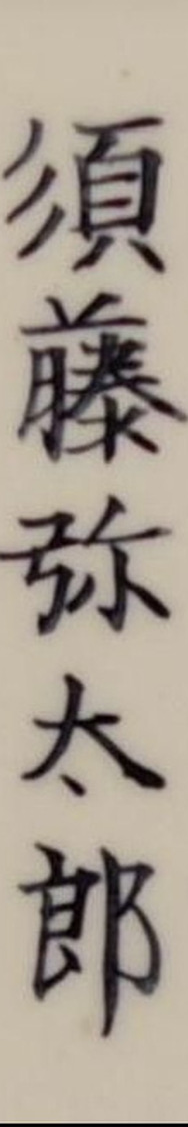須藤弥太郎
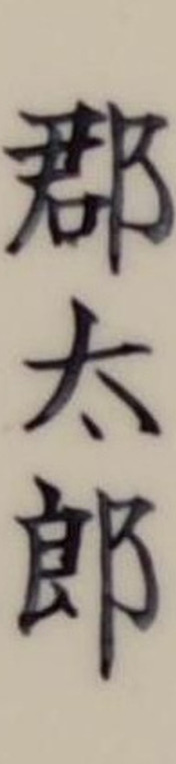郡太郎
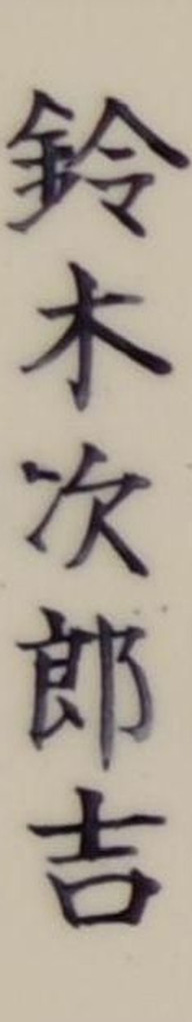鈴木次郎吉
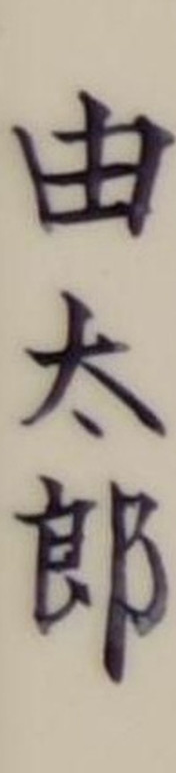由太郎

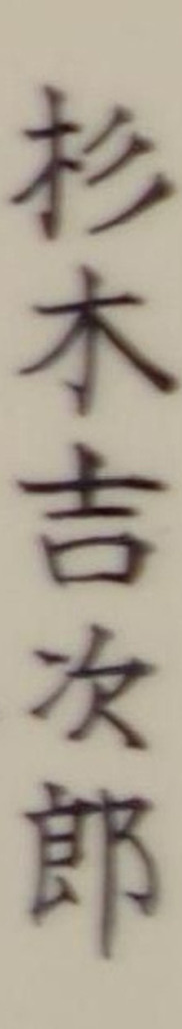杉木吉次郎
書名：M~S
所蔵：高野山金剛峯寺
